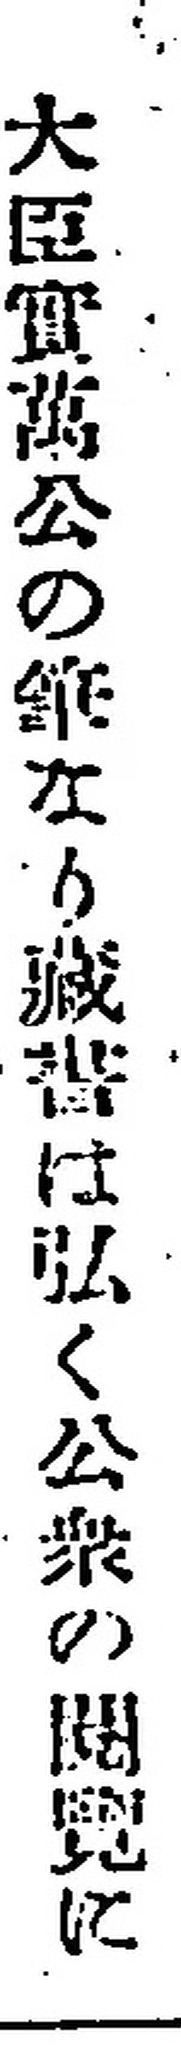大臣実万公の筆なり蔵書は弘く公衆の閲覧に
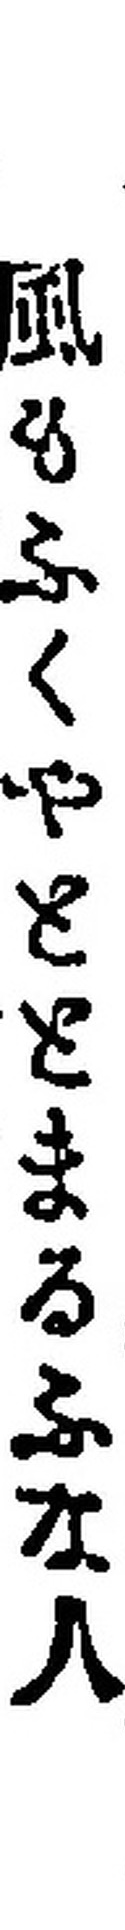風もふくやととまるふな人
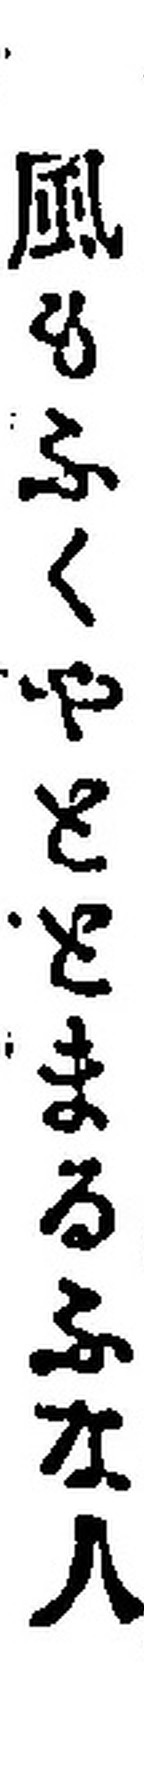風もふくやととまるふな人
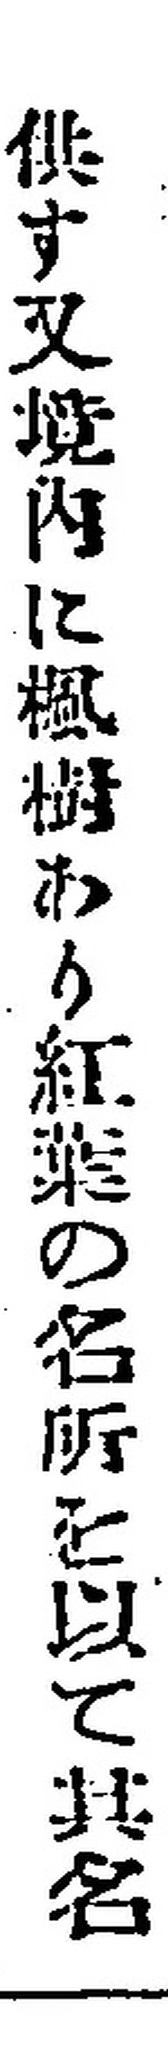供す又境内に楓樹あり紅葉の名所を以て其名
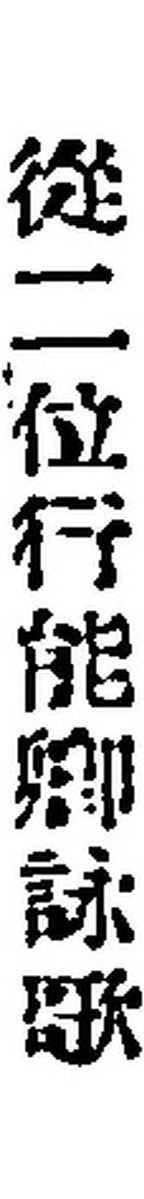従二位行能卿詠歌
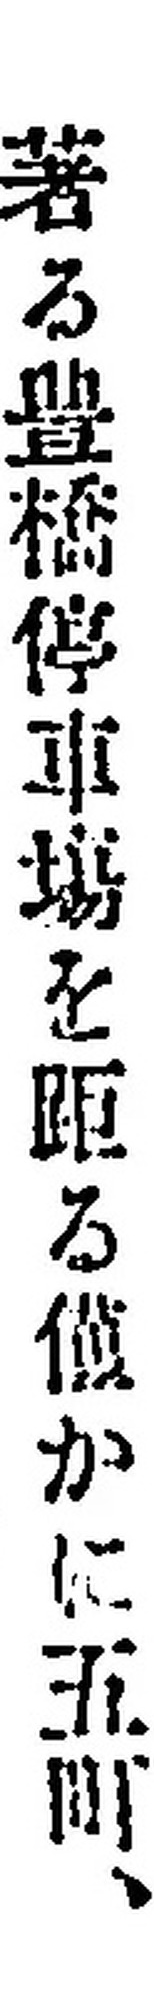著る豊橋停車場を距る僅かに五町、
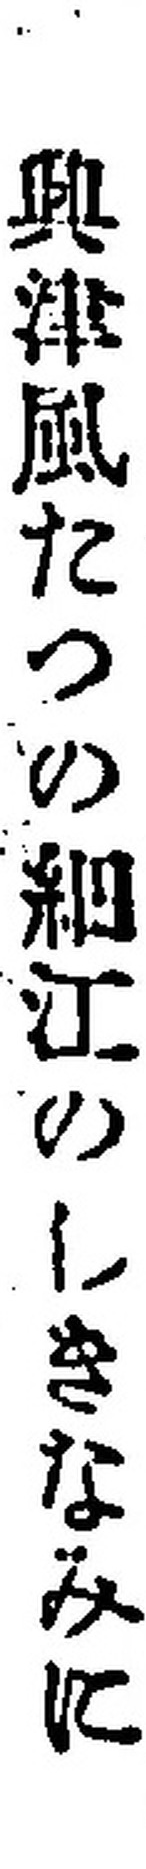興津風たつの細江のしきなみに
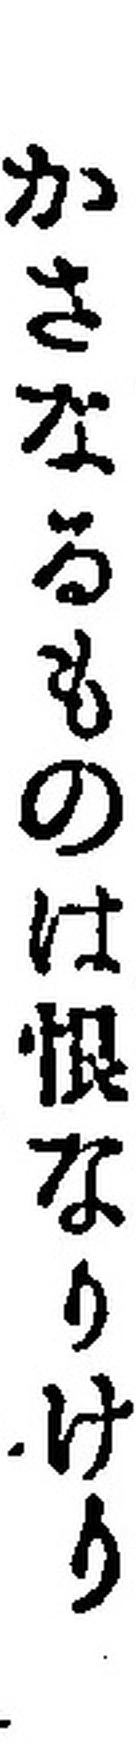かさなるものは恨なりけり
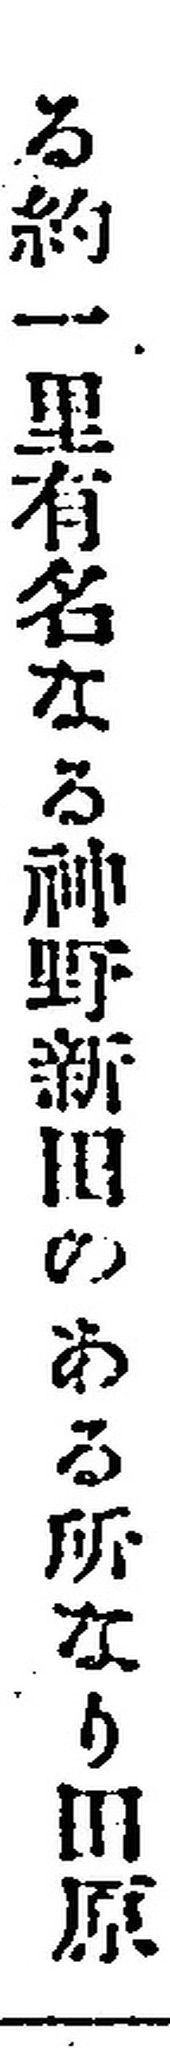る約一里有名なる神野新田のある所なり田原
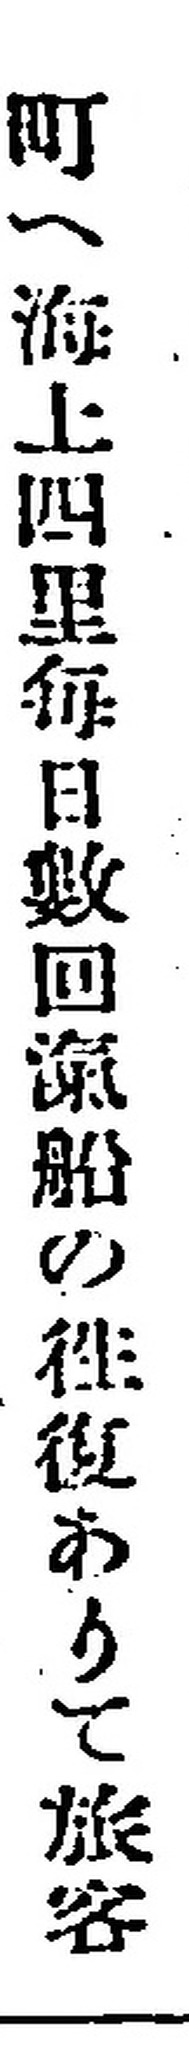町へ海上四里毎日数回汽船の往復ありて旅客
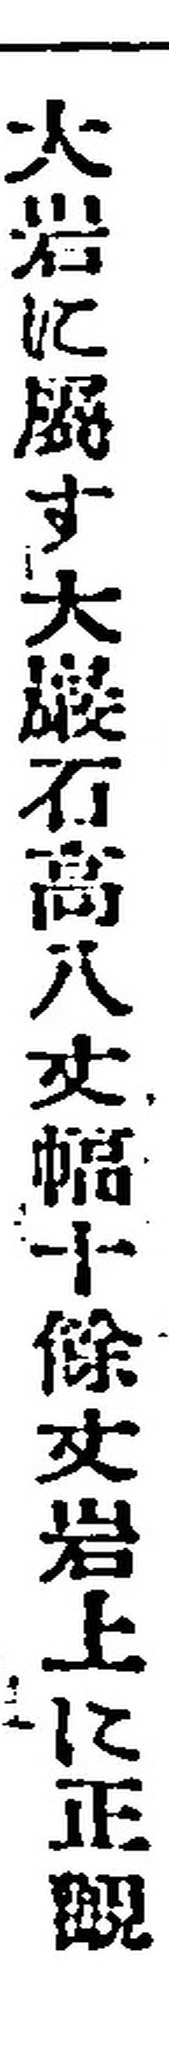大岩に属す大厳石高八丈幅十余丈岩上に正観
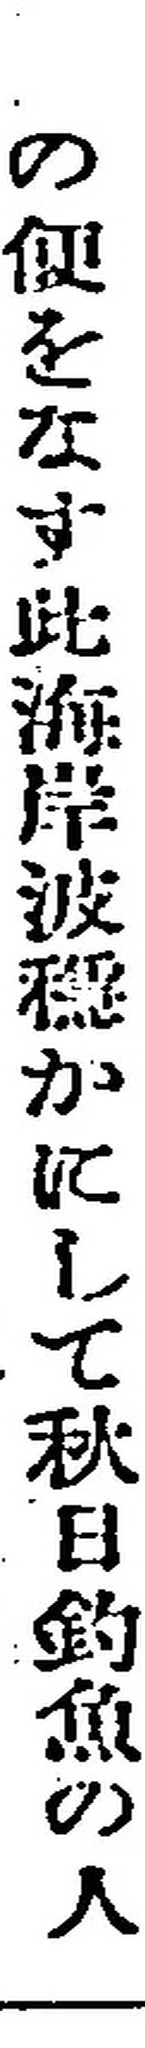の便をなす此海岸波穏かにして秋日釣魚の人
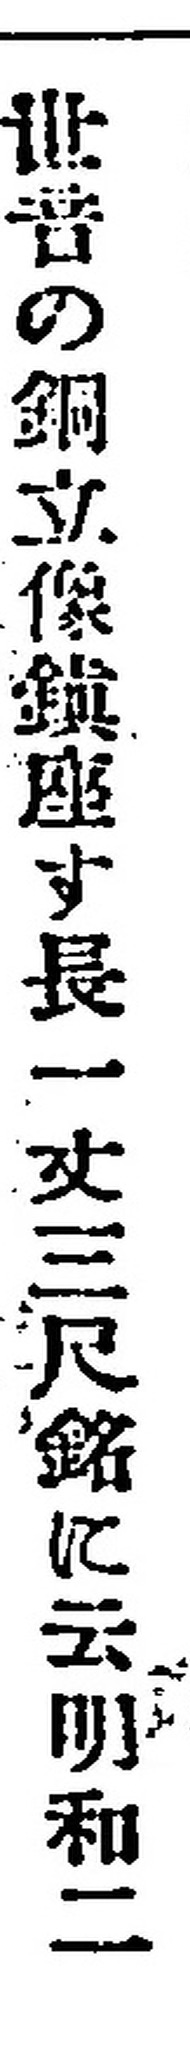世音の銅立像鎮座す長一丈三尺銘に云明和二
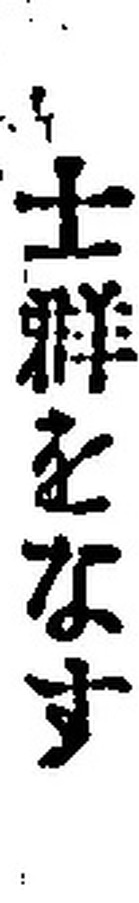士群をなす
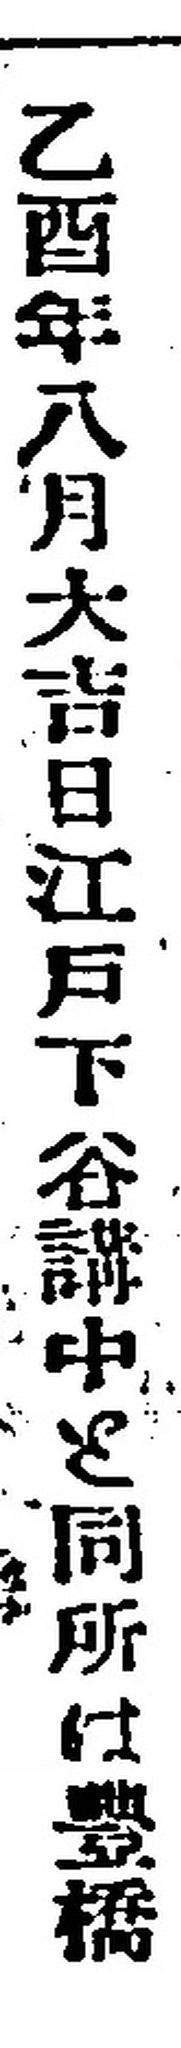乙酉年八月大吉日江戸下谷講中と同所は豊橋

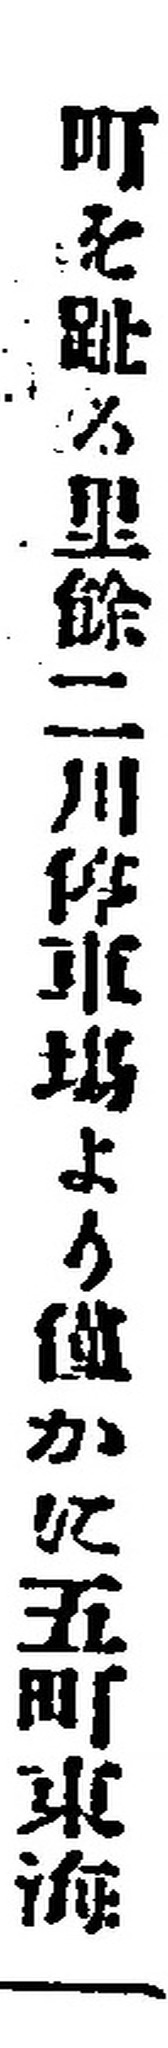町を趾る里余二川停車場より僅かに五町東海
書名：東参名勝案内
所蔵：国立国会図書館 National Diet Library, JAPAN
